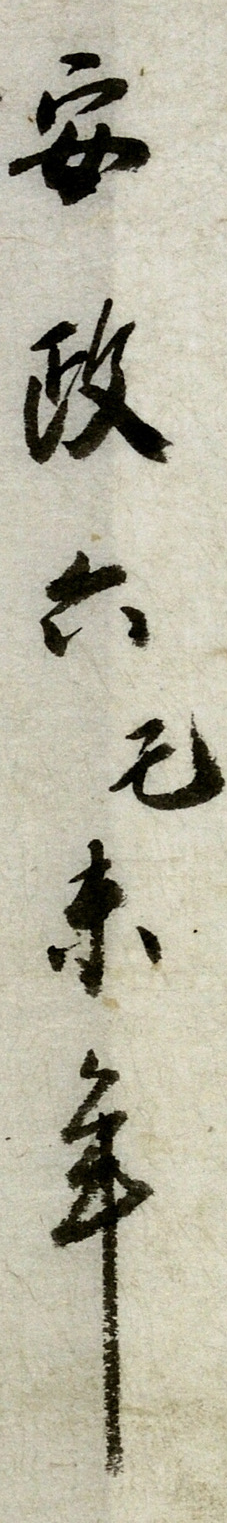安政六己未年
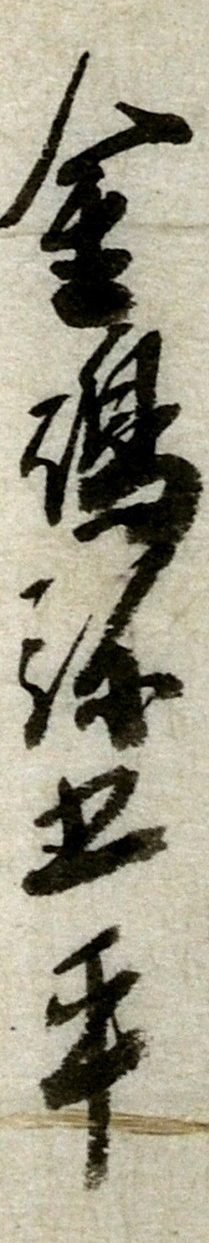金嶋弥五平

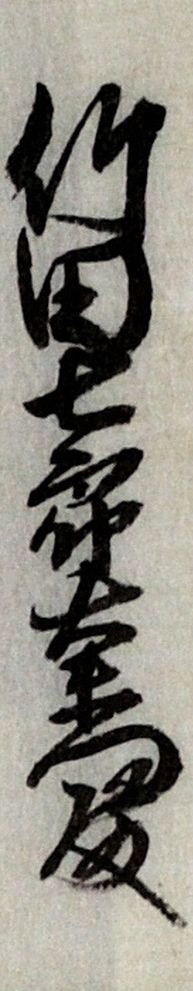竹田七郎右衛門殿
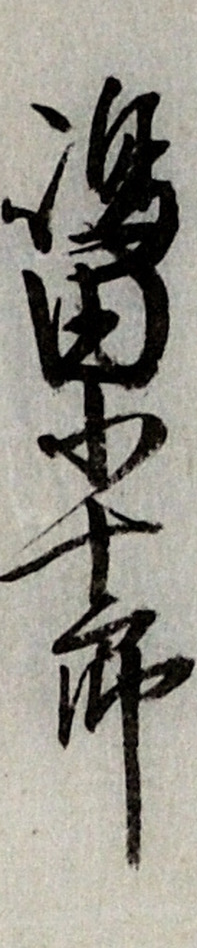嶋田小十郎
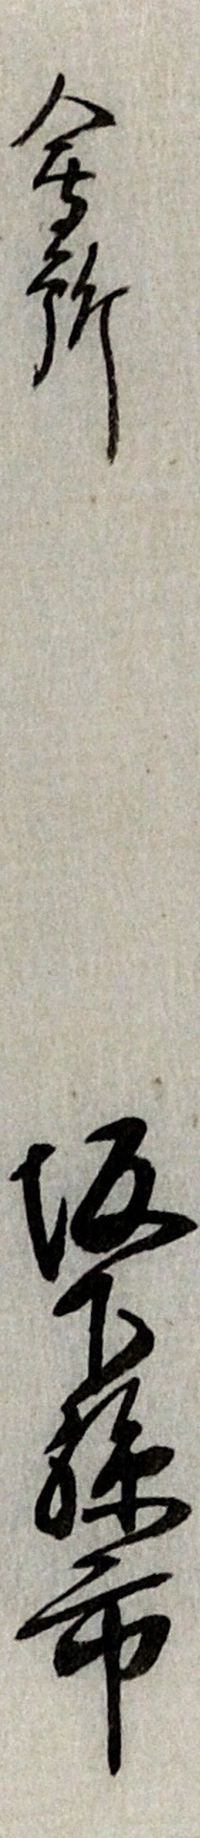会所坂下孫市
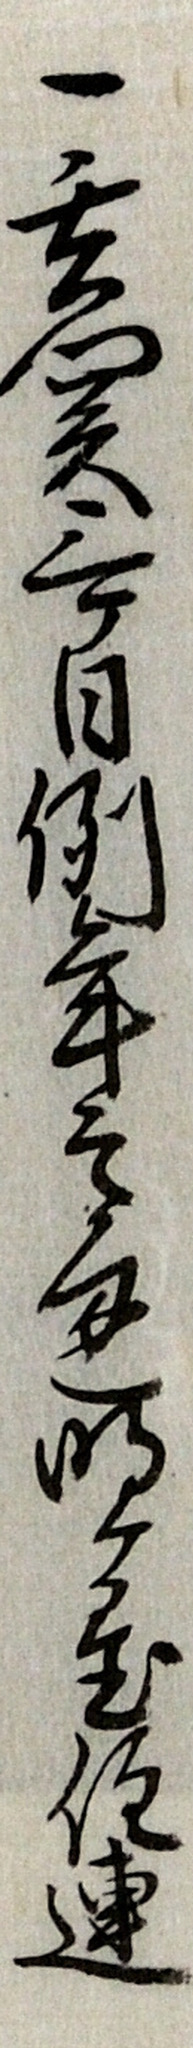一玄関三ケ日例年之通明ケ置住連
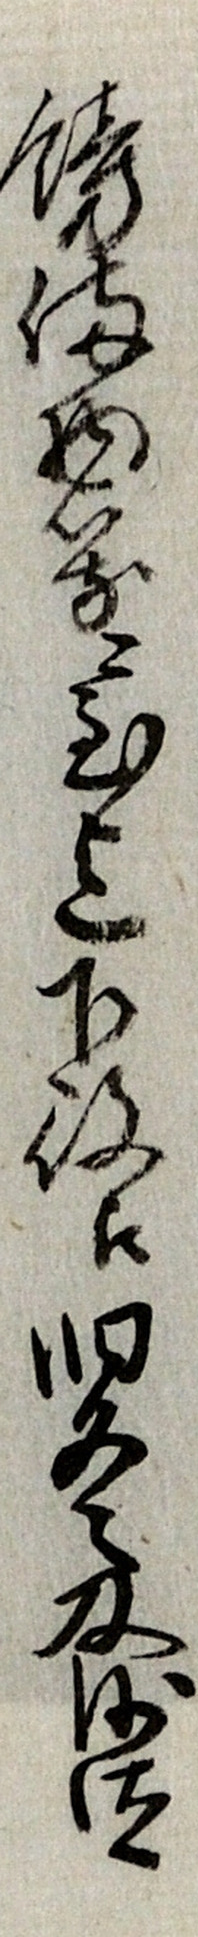錺備物等ニ至迄下役江旧冬及沙汰
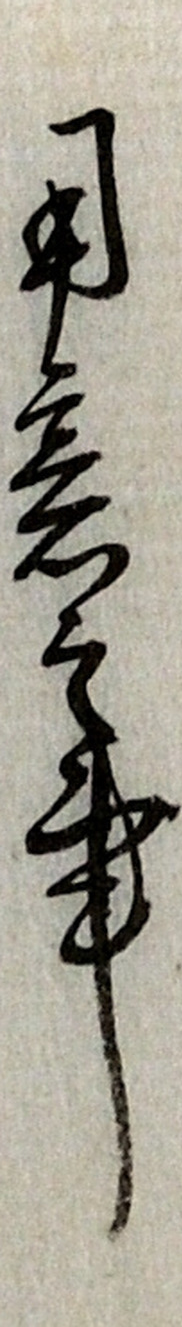用意之事
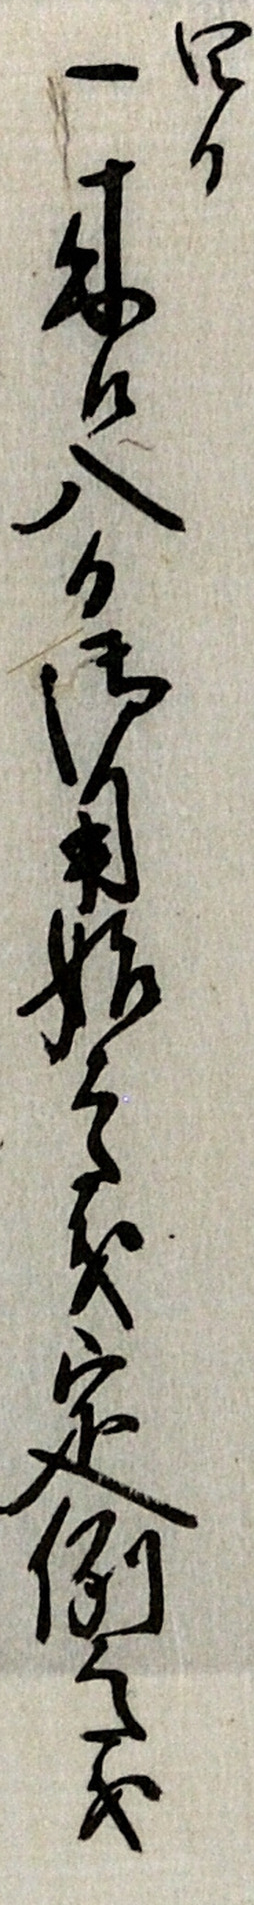一来ル八日御用始之義定例之義
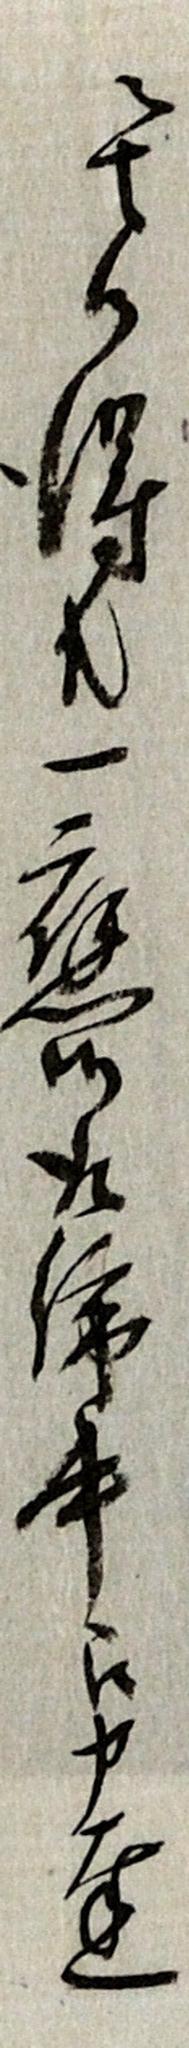ニ者候得共一応御取締中江申達
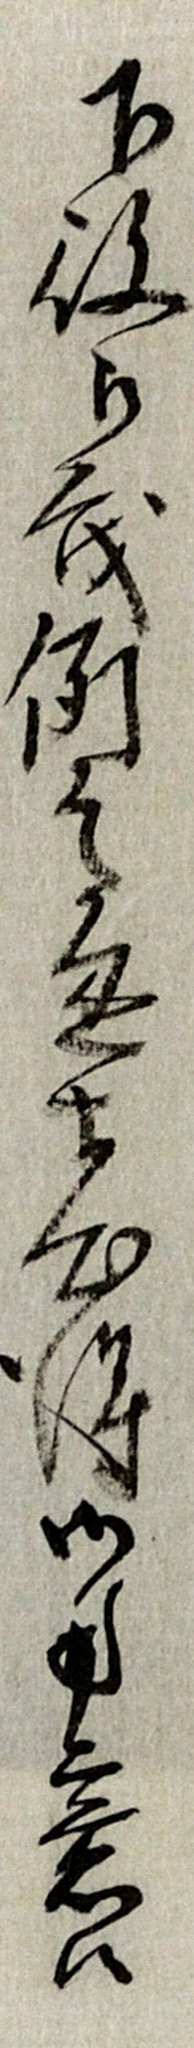下役江茂例之通相心得御用意候
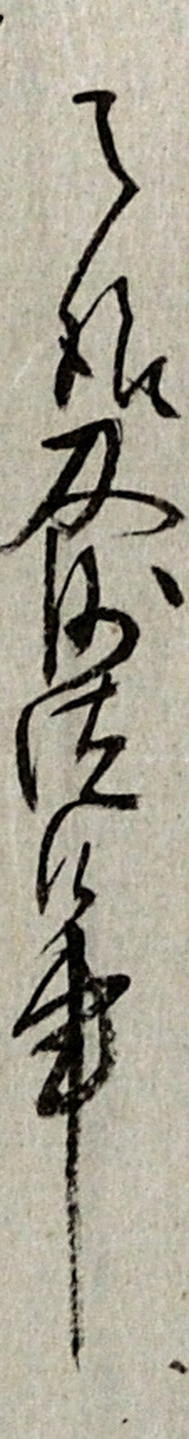之様及沙汰候事
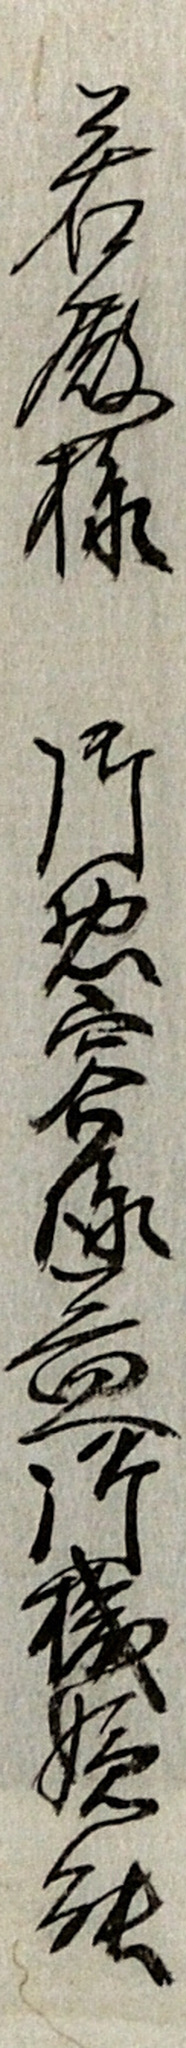若殿様御惣容様益御機嫌能
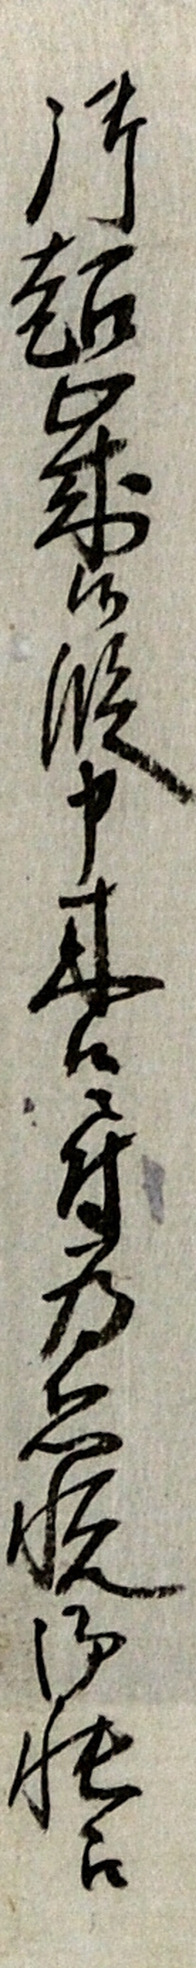御超歳候段申来候ニ付為恐悦御帳江
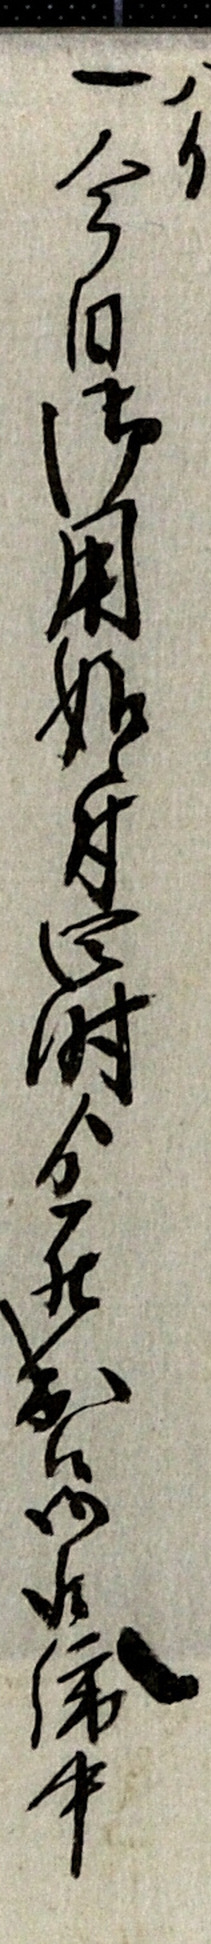一今日御用始ニ付四時ゟ罷出候御取締中
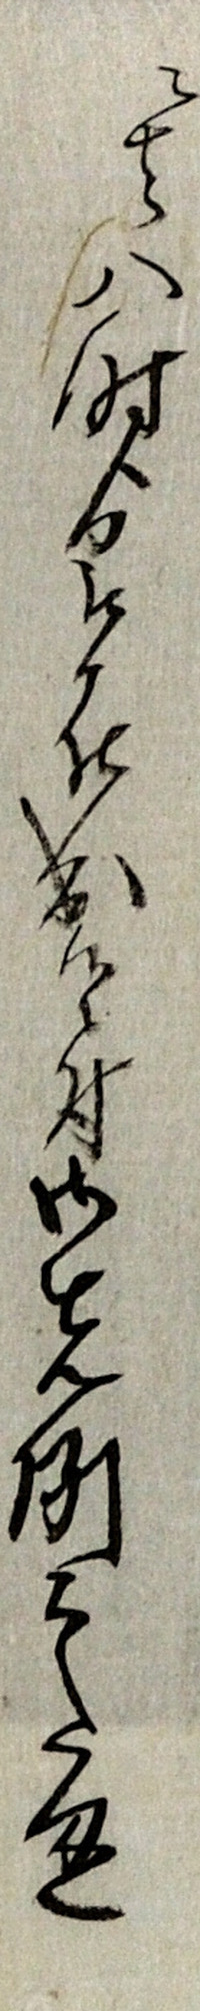ニ者八時ゟ被罷出候ニ付御先例之通
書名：諸事御用留
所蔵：伊那市立高遠町図書館・合同会社AMANE
